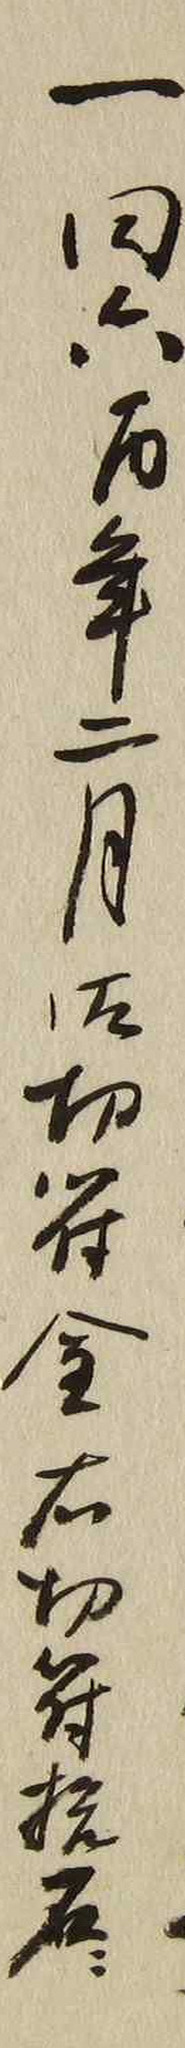一同六酉年二月御切符金右切符拾石に
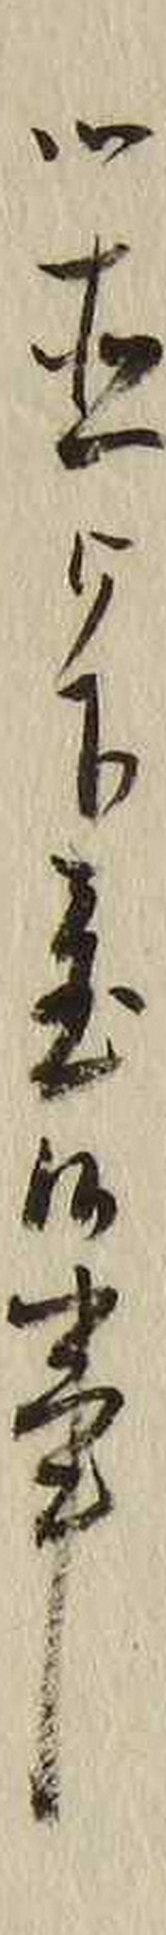御直被下置候事
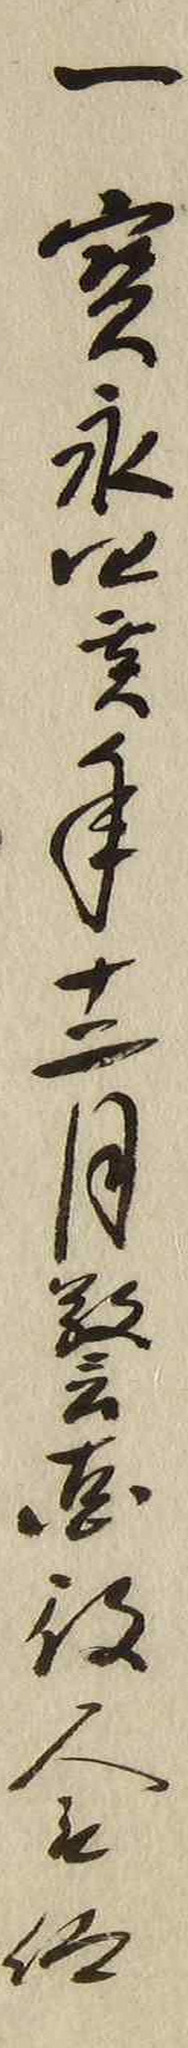一宝永四亥年十二月警固役人被仰
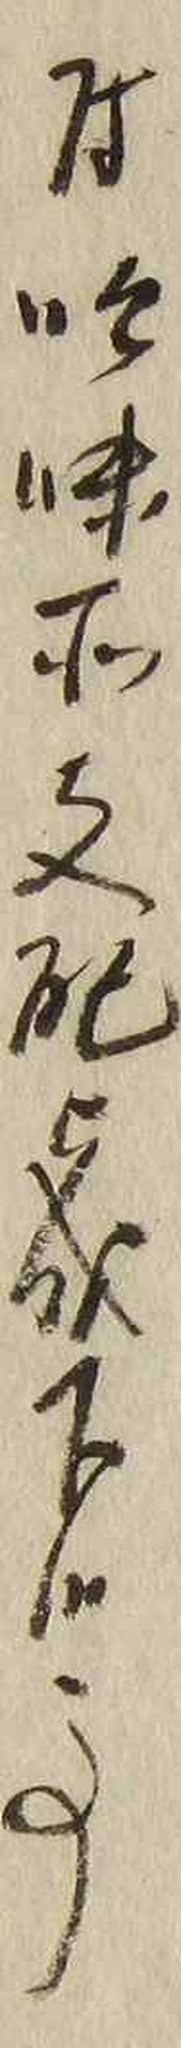付吟味所支配被成下候事
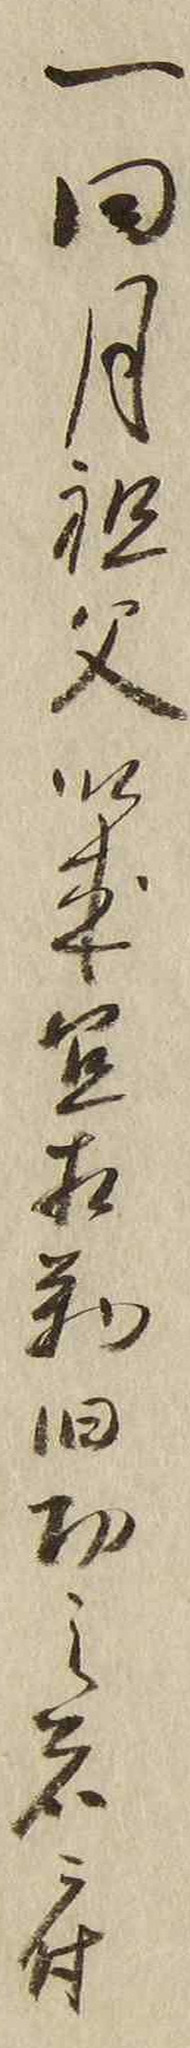一同月祖父以来宜相勤旧功之者に付

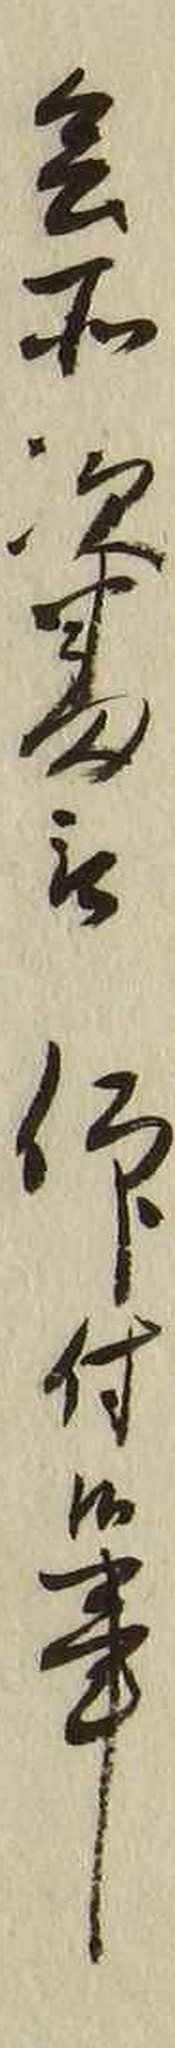会所次番被仰付候事
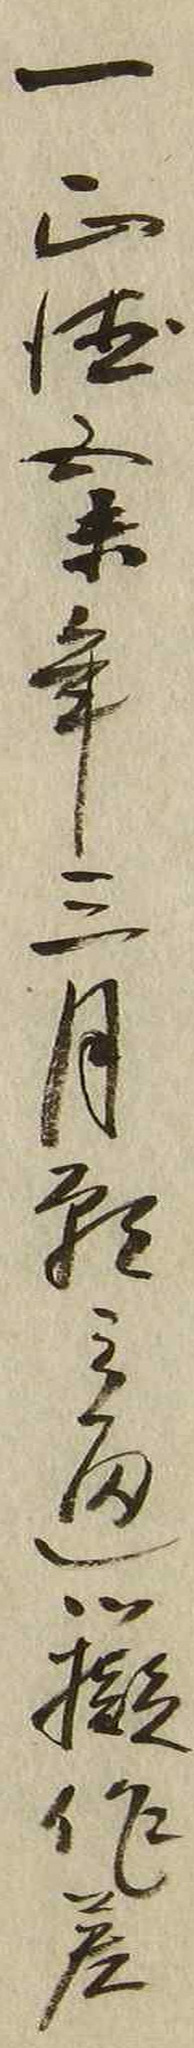一正徳五未年三月願之通御擬作差
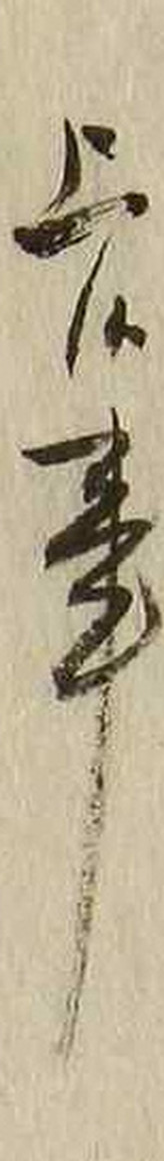上候事
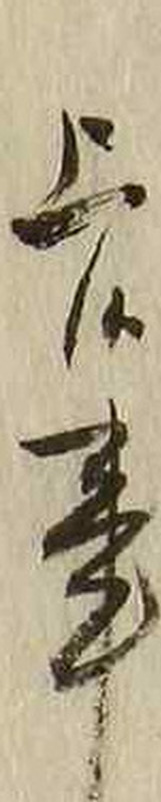上候事
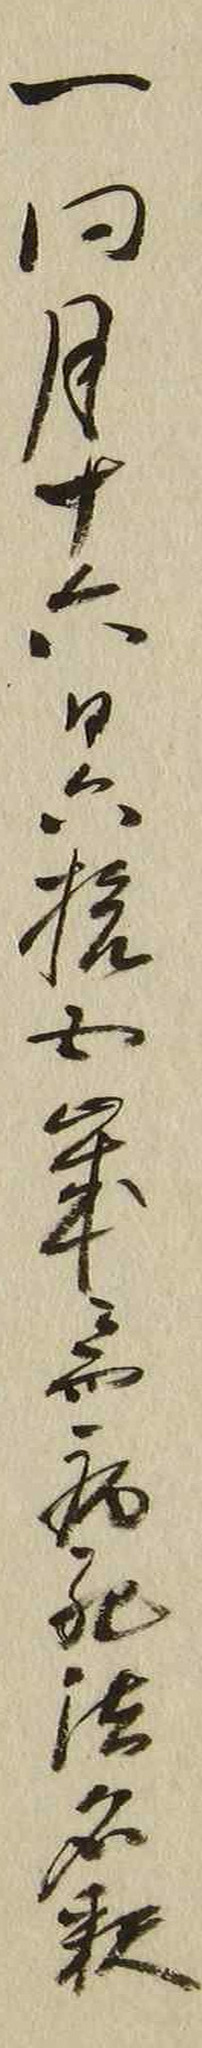一同月十六日六拾五歳に而病死法名釈
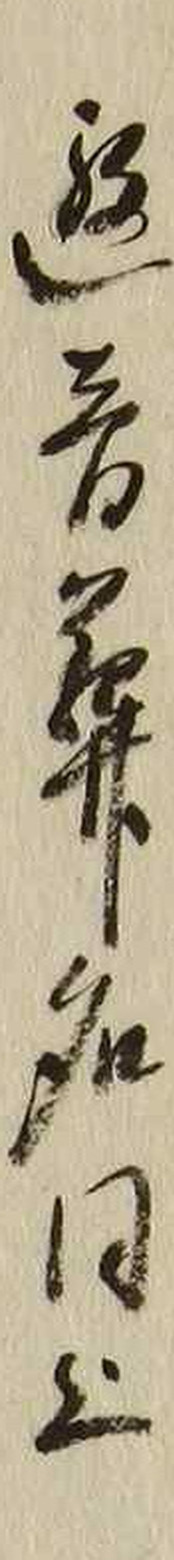遊音葬処同上
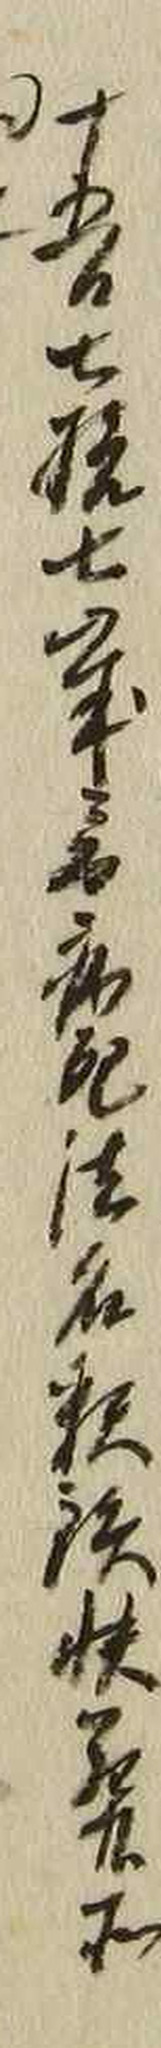十五日七拾七歳に而病死法名釈鉄快葬所
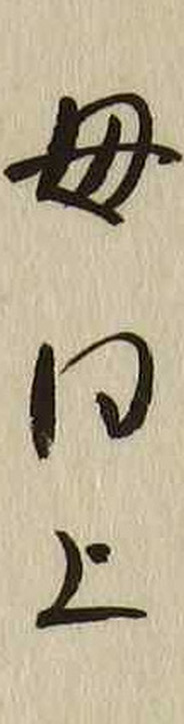母同上
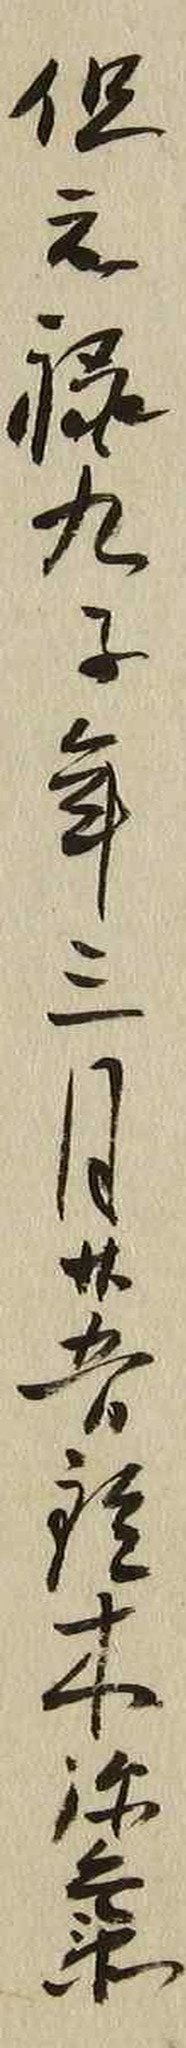但元禄九子年三月廿九日鈴木弥兵衛
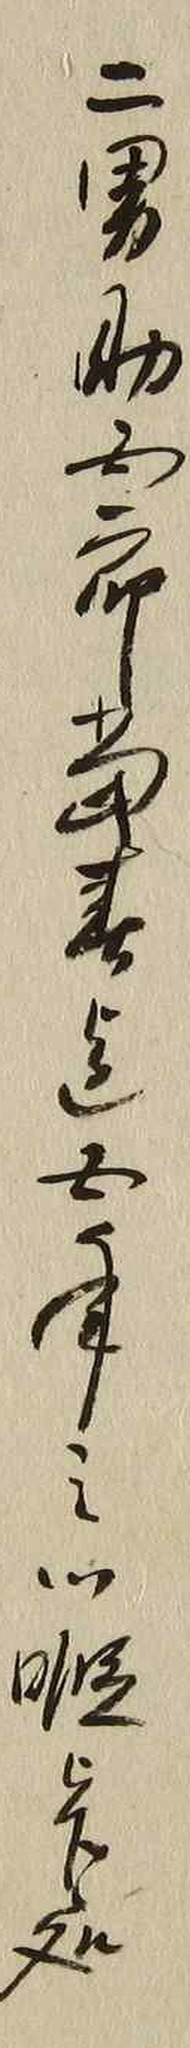二男助五郎当春迄五年之御暇被下候処
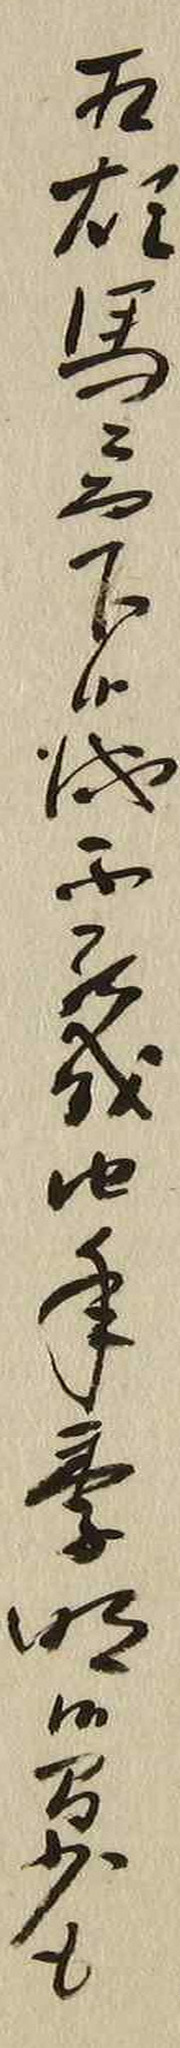相煩馬に而下候儀不罷成由年季明候間少も
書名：諸士系譜　巻之360　す之部10
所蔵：会津若松市立会津図書館
